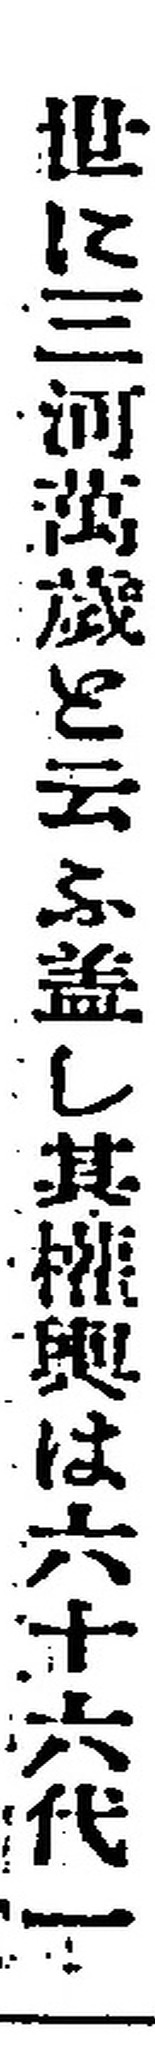世に三河万歳と云ふ蓋し其権輿は六十六代一
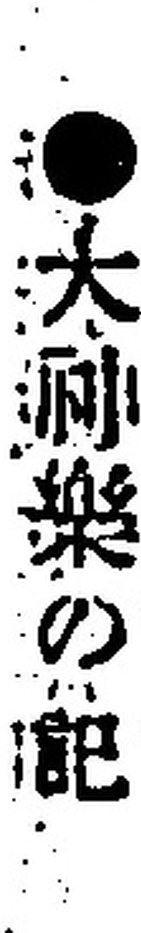●大神楽の記
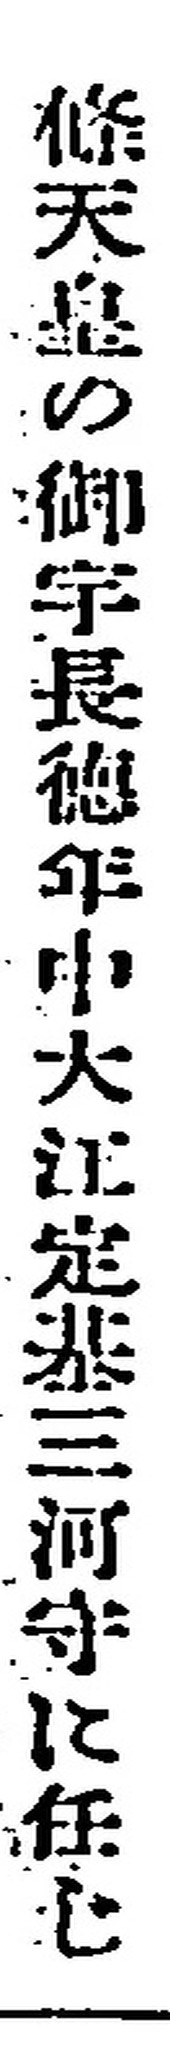条天皇の御宇長徳年中大江定基三河守に任じ
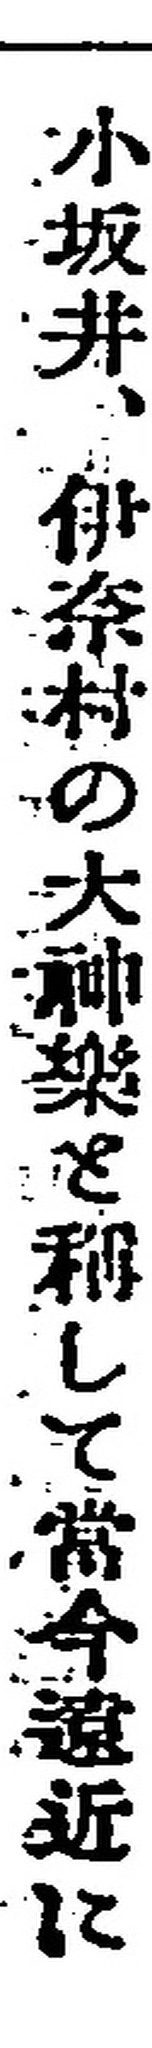小坂井、伊奈村の大神楽と称して当今遠近に
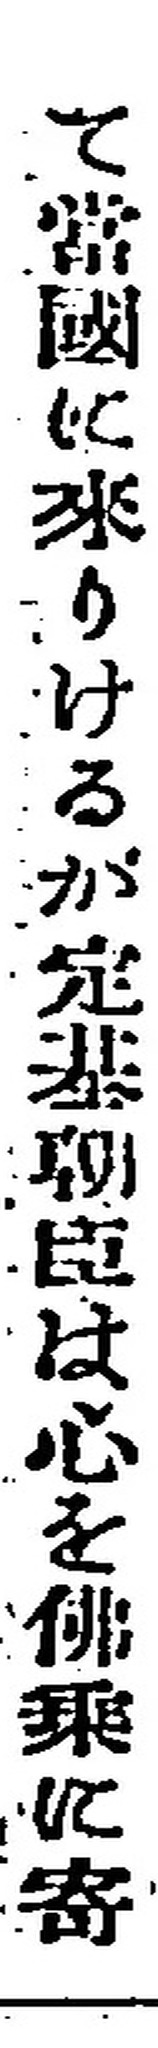て当国に来りけるが定基朝臣は心を仏乗に寄
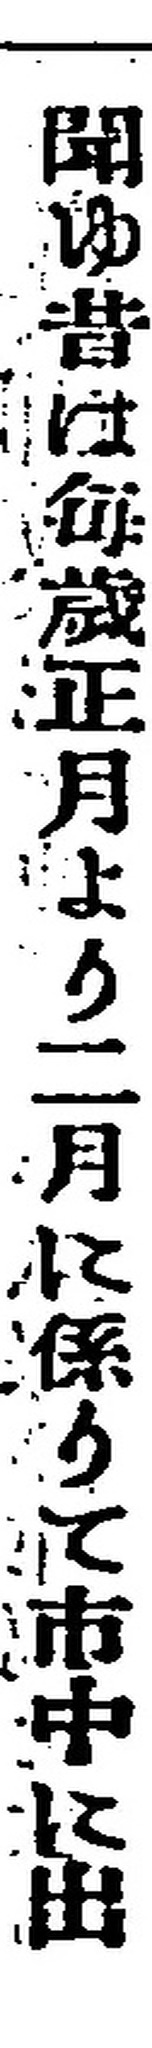聞ゆ昔は毎歳正月より二月に係りて市中に出
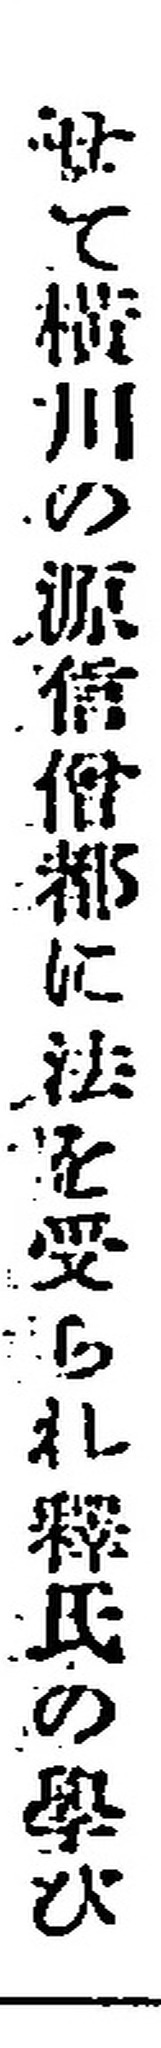せて横川の源信僧都に法を受られ釈氏の学び
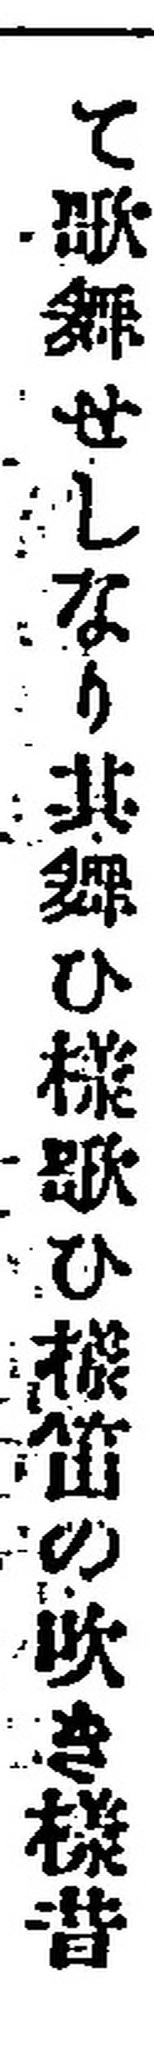て歌舞せしなり其舞ひ様歌ひ様笛の吹き様昔
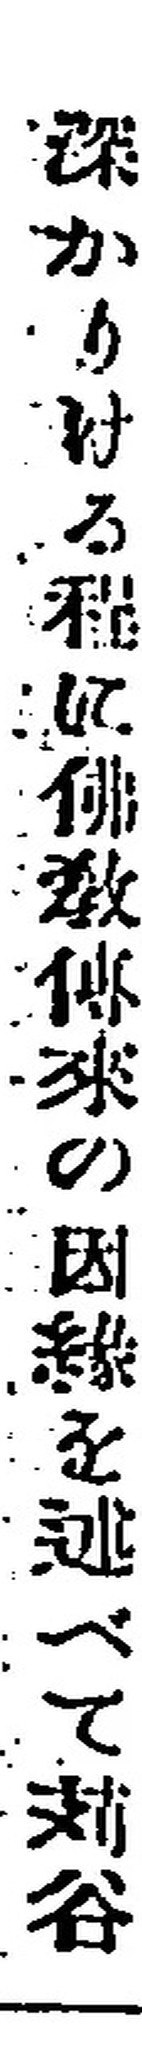深かりける程に仏教伝来の因縁を述べて苅谷
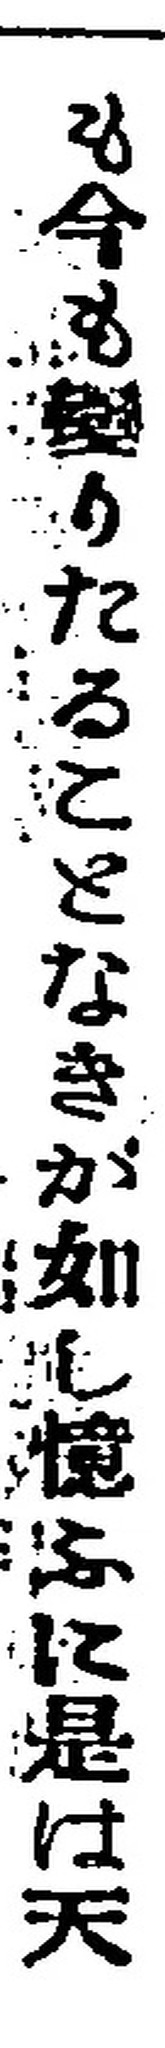も今も変りたることなきが如し憶ふに是は天
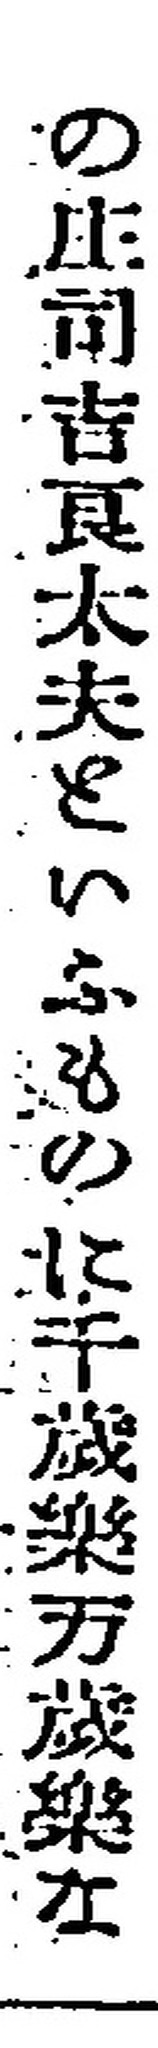の庄司吉良太夫といふものに千歳楽万歳楽な
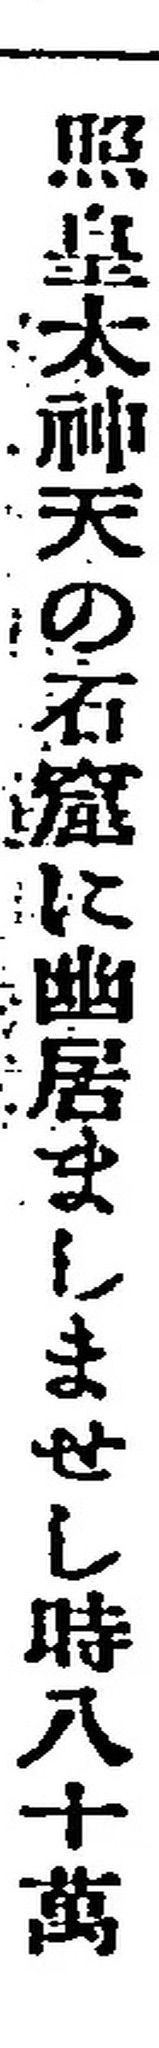照皇太神天の石窟に幽居ましませし時八十万
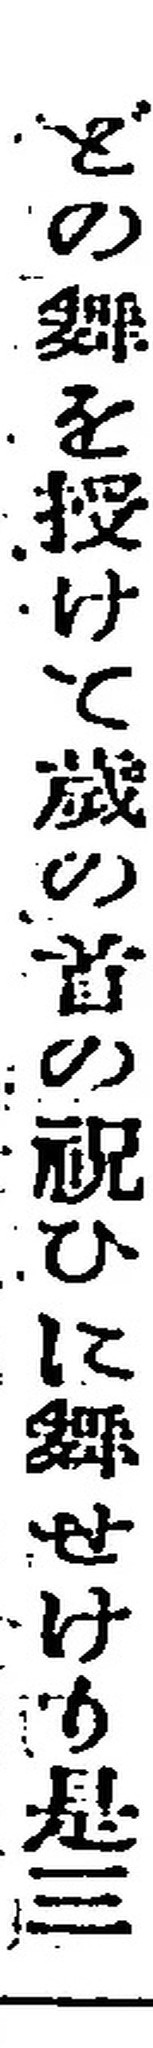どの舞を授けて歳の首の祝ひに舞せけり是三
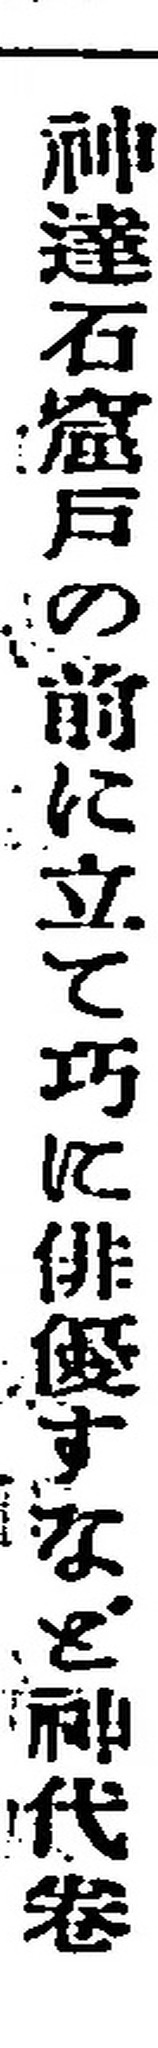神達石窟戸の前に立て巧に俳優すなど神代巻
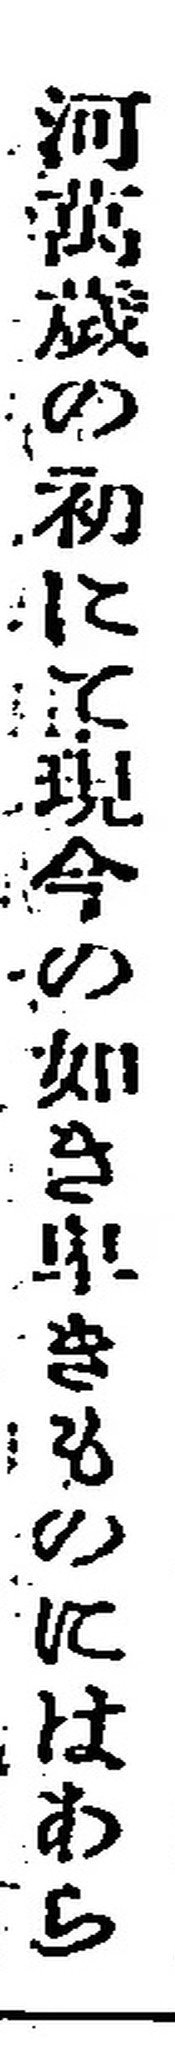河万歳の初にて現今の如き卑きものにはあら
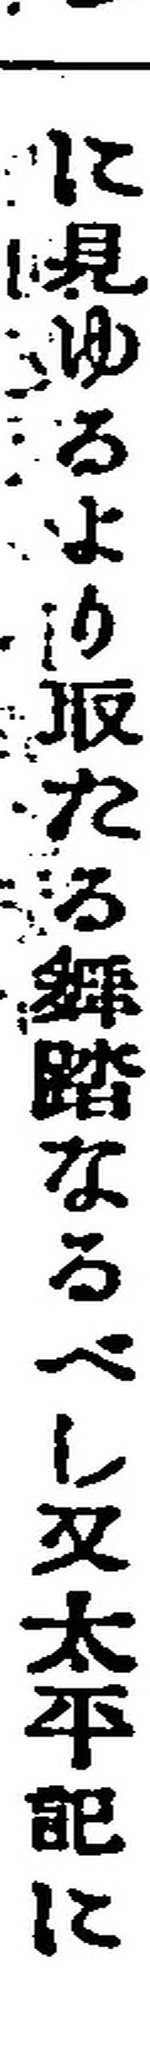に見ゆるより取たる舞踏なるべし又太平記に
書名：東参名勝案内
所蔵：国立国会図書館 National Diet Library, JAPAN
